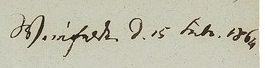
Weinfelden d. 15 Febr. 1864
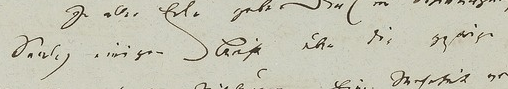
Saale) einige Berichte über die gestrige
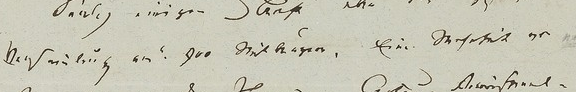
Versammlung von ca 700 Mitbürgern. Eine Mehrheit von
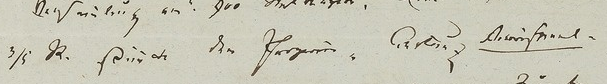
⅗ St. stimmte dem Programme «ConstanzAmrisweil–
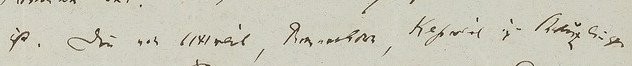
ist. Denn von Uttweil, Romanshorn, Kessweil &.Kreuzlingen
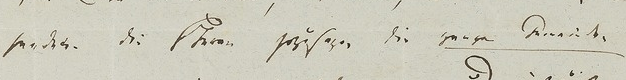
sendeten die Herrn sozusagen die ganzen Gemeinden
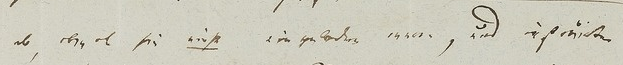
ab, obwol sie nicht eingeladen waren, und instruirten
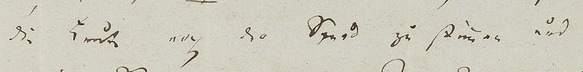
die Leute nach der S... zu stimmen und
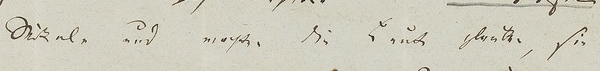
Mitteln und machten die Leute glauben, sie
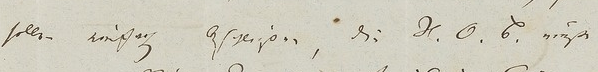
sollen einfach beschließen, die N.O.B. müsse
